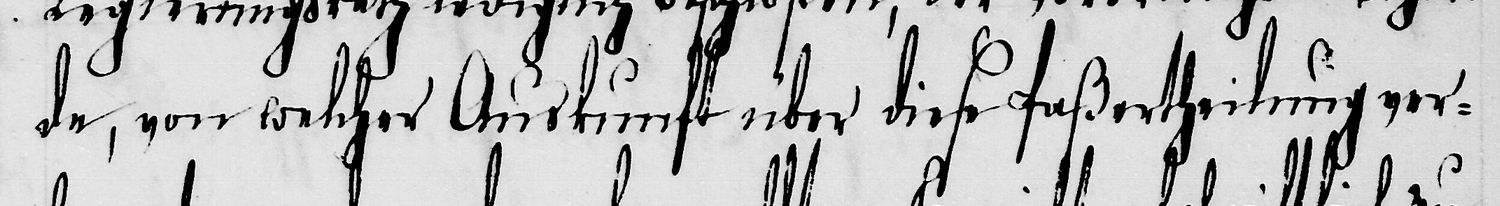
de, von welcher Auskunft über diese Paßertheilung ver¬
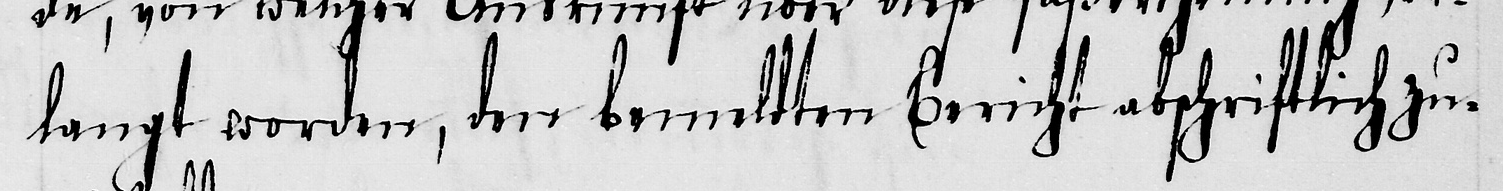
langt worden, den bemeldten Bericht abschriftlich z¬
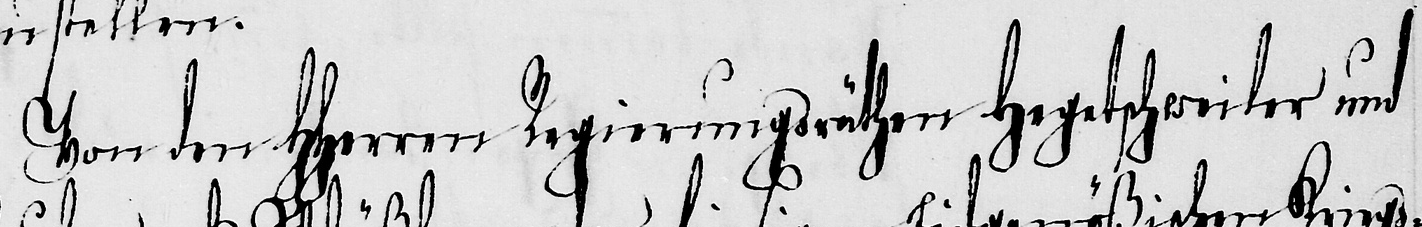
Von den HHerren Regierungsräthen Hegetschweiler
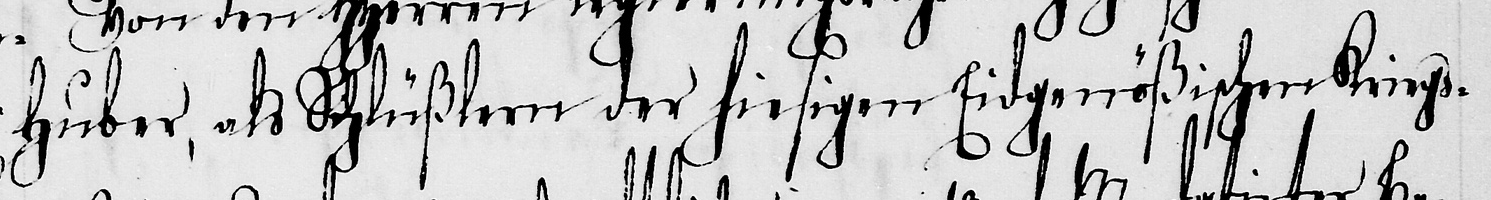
Huber, als Schlüßlern der hiesigen Eidgenößischen Krieg¬
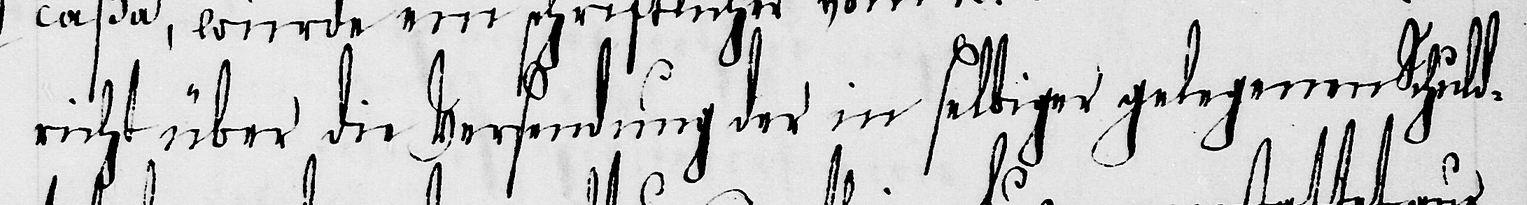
richt über die Versendung der in selbiger gelegenen Schul¬
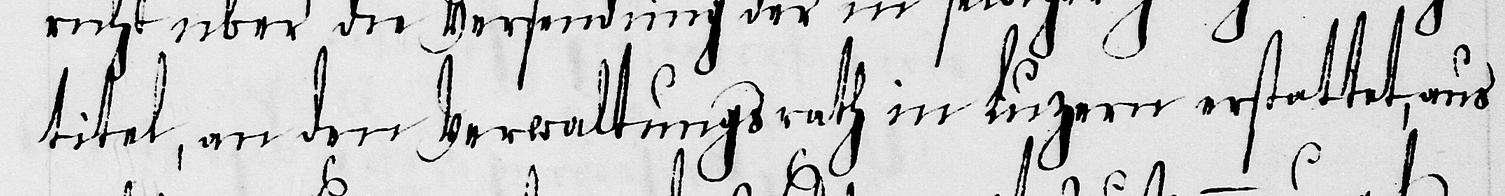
dtitel, an den Verwaltungsrath in Luzern erstattet, aus
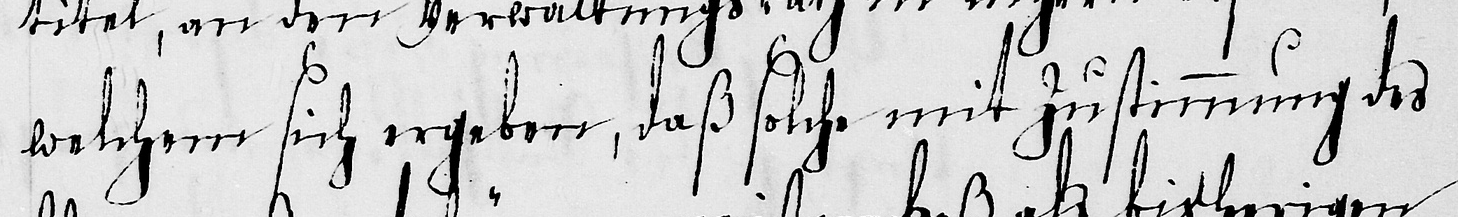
welchem sich ergeben, daß solche mit Zustimmung des
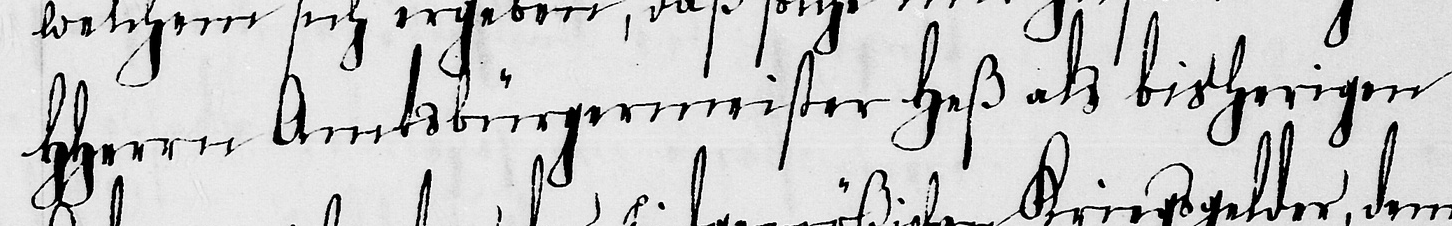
HHerrn Amtsbürgermeister Heß als bisherigen
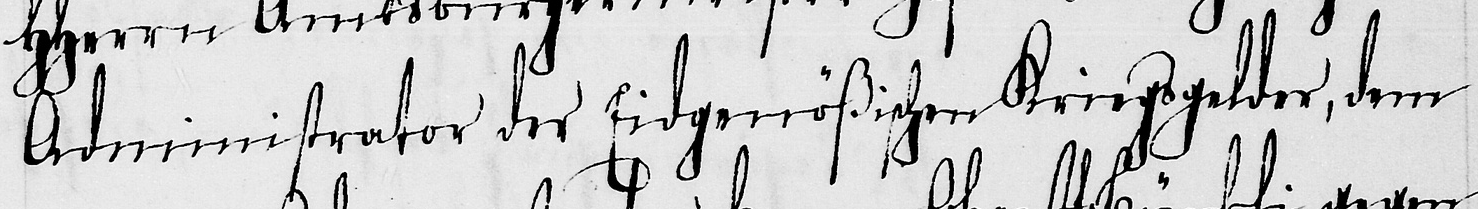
Administrator der Eidgenößischen Kriegsgelder, dem
